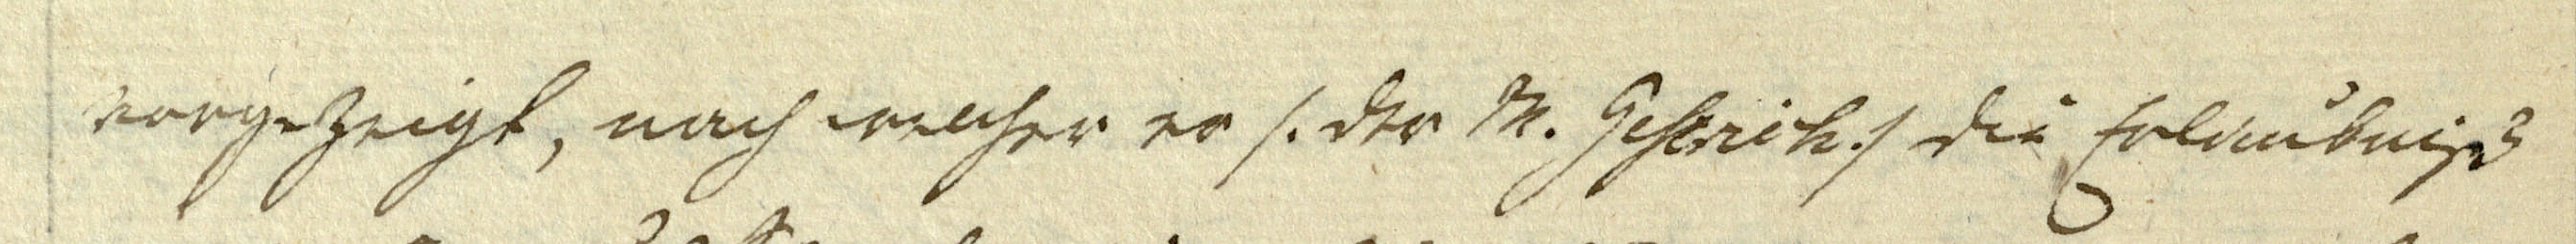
vorgezeigt, nach welcher er /: der M. Gestrich ./ die Erlaubnis
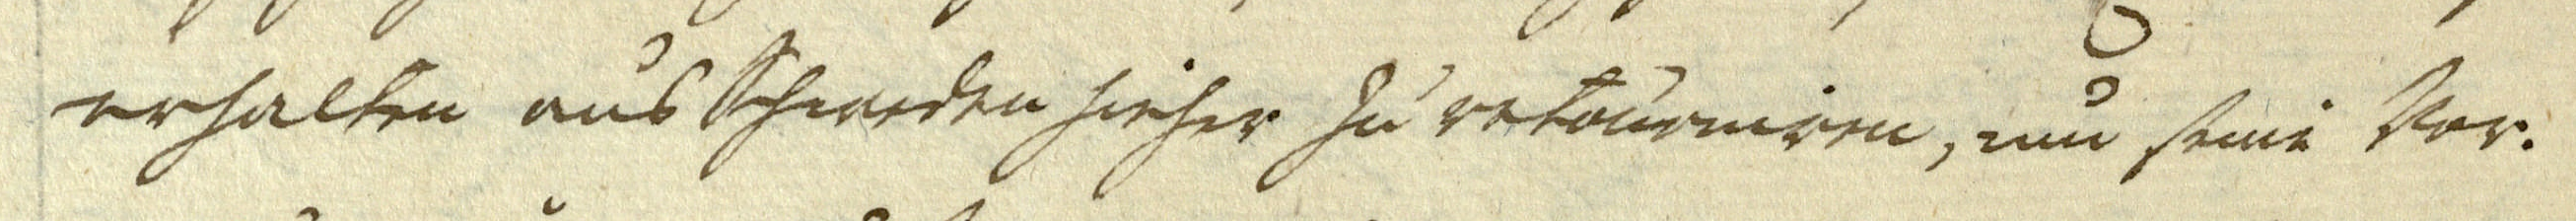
erhalten aus Schweden hieher zu retourniren, um seine Vor¬
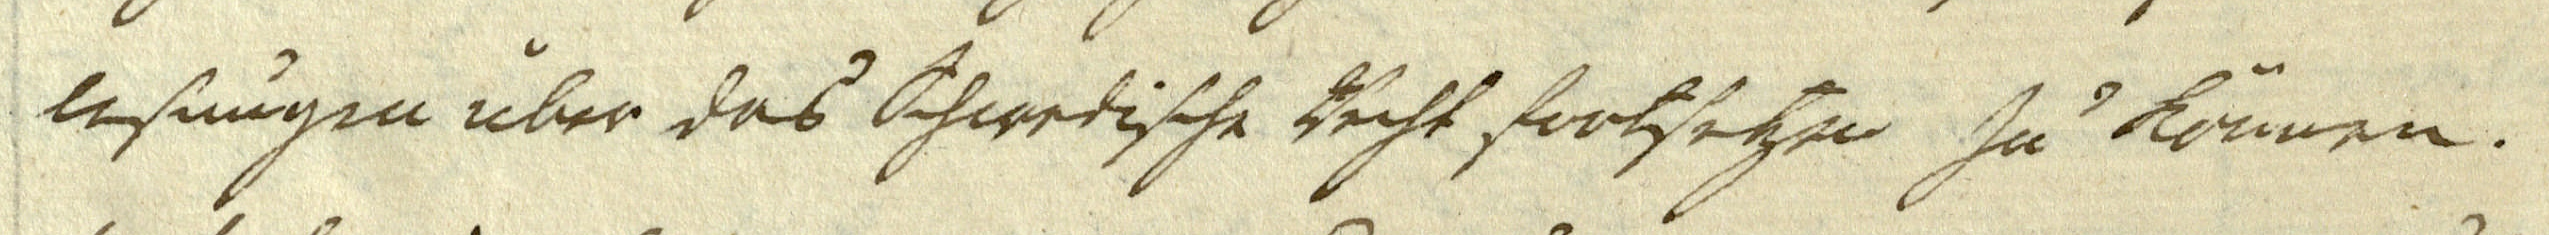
lesungen über das Schwedische Recht fortsetzen zu können.
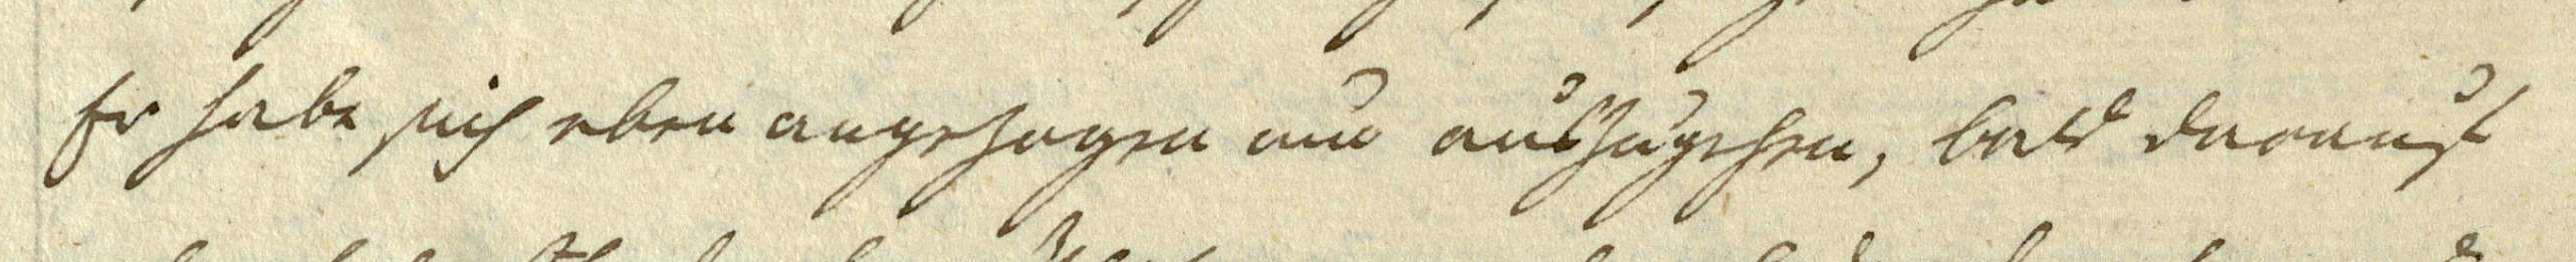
Er habe sich eben angezogen um auszugehen, bald darauf
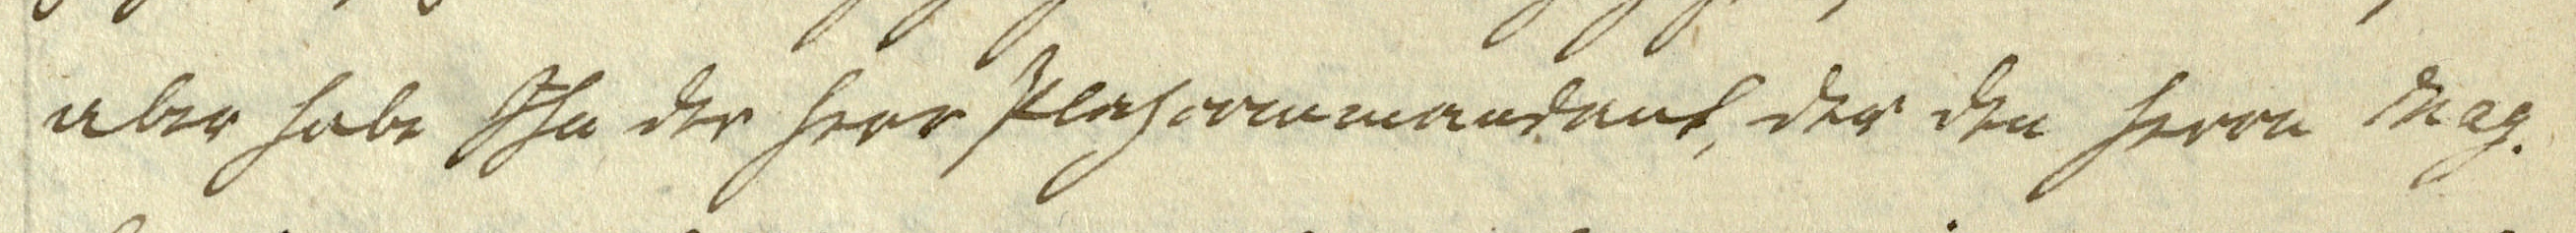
aber habe Ihn der Herr Plazcommandant, der den Herrn Mag.
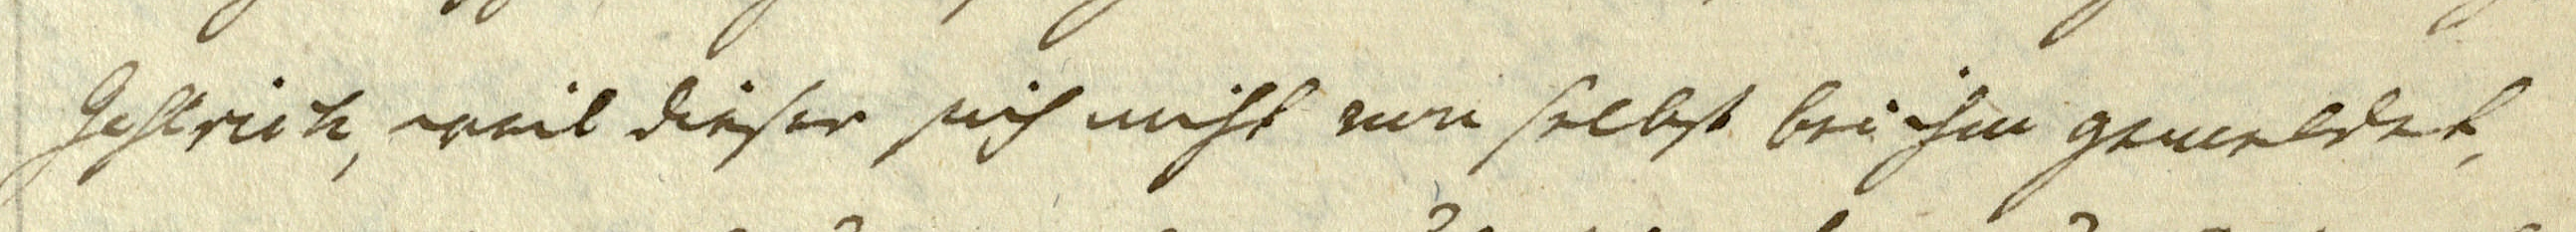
Gestrich, weil dieser sich nicht von selbst bei ihm gemeldet,
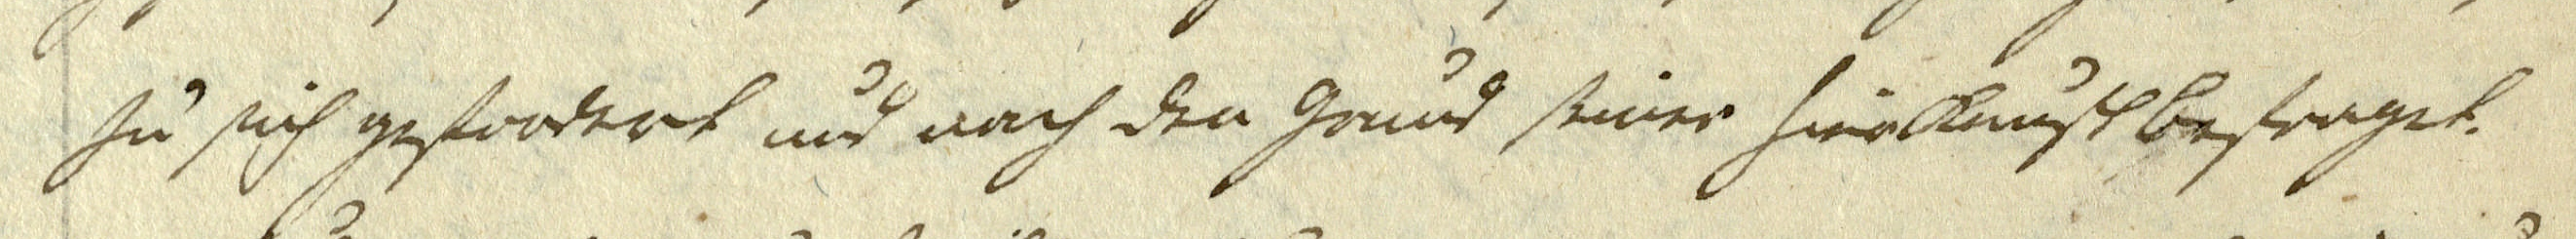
zu sich gefordert und nach den Grund seiner Hierkunft befraget,
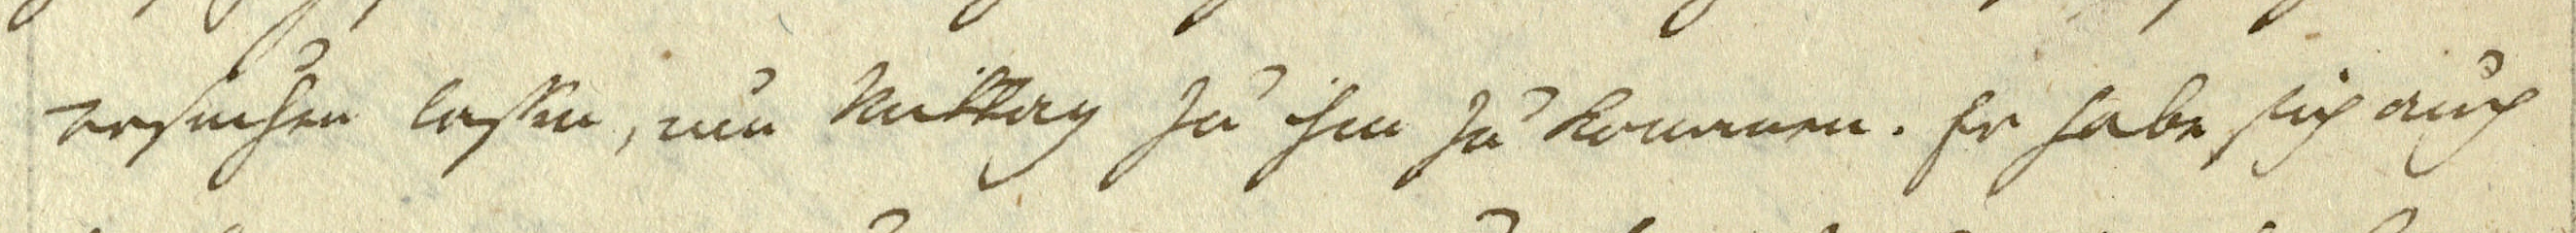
ersuchen lassen, um Mittag zu ihm zu kommen. Er habe sich auch
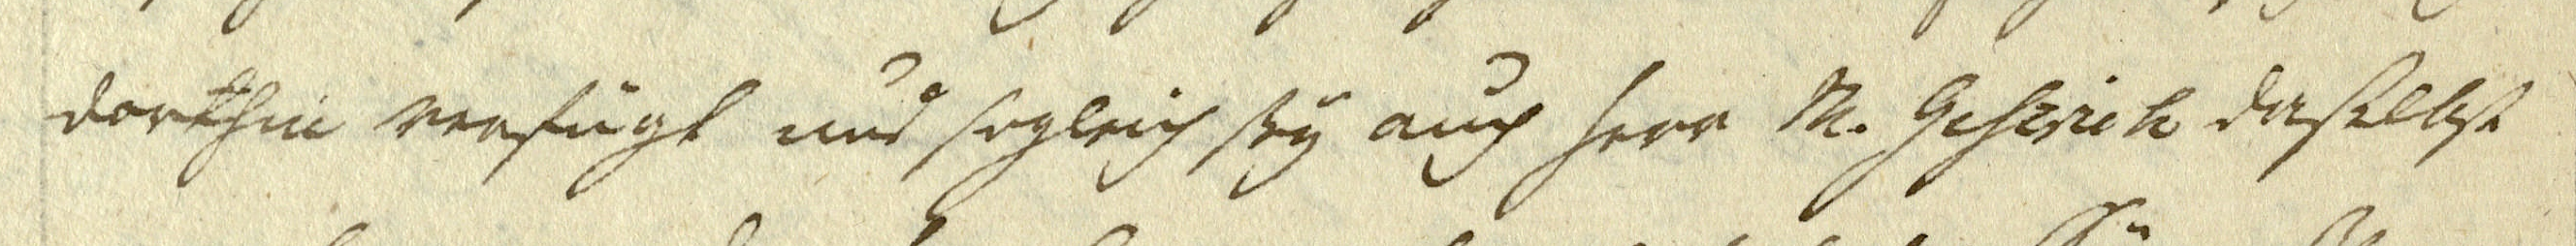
dorthin verfügt und sogleich seÿ auch Herr M. Gestrich daselbst
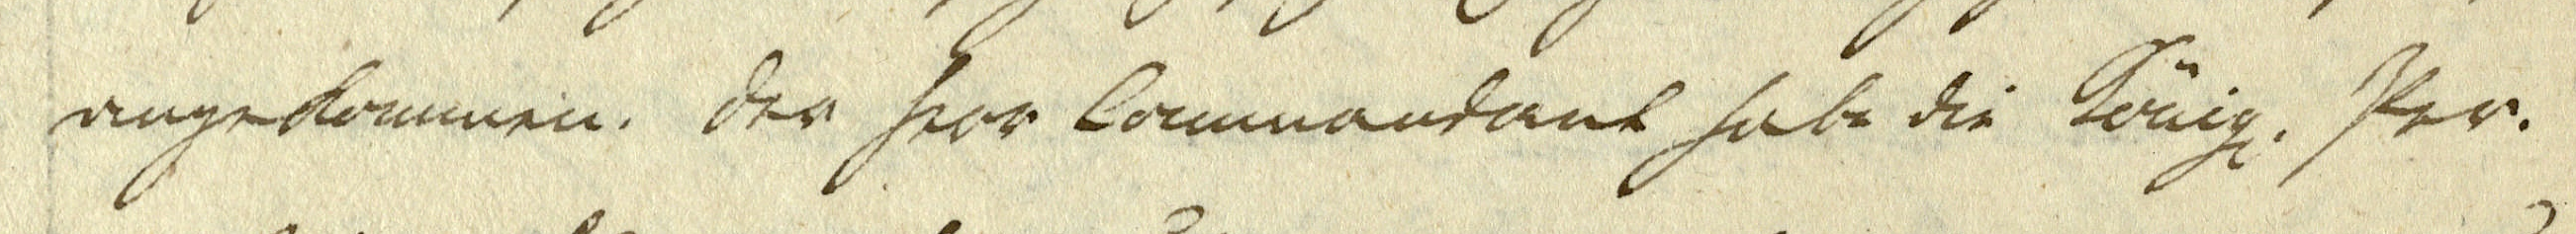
angekommen. Der Herr Commandant habe die Königl. Per¬
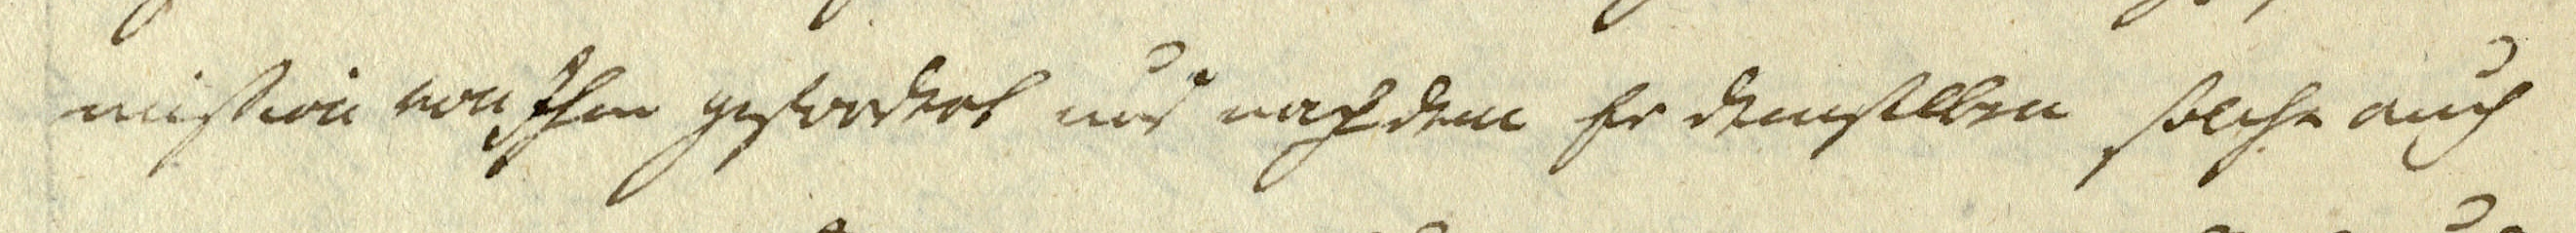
mission von ihm gefordert und nachdem Er demselben solche auch
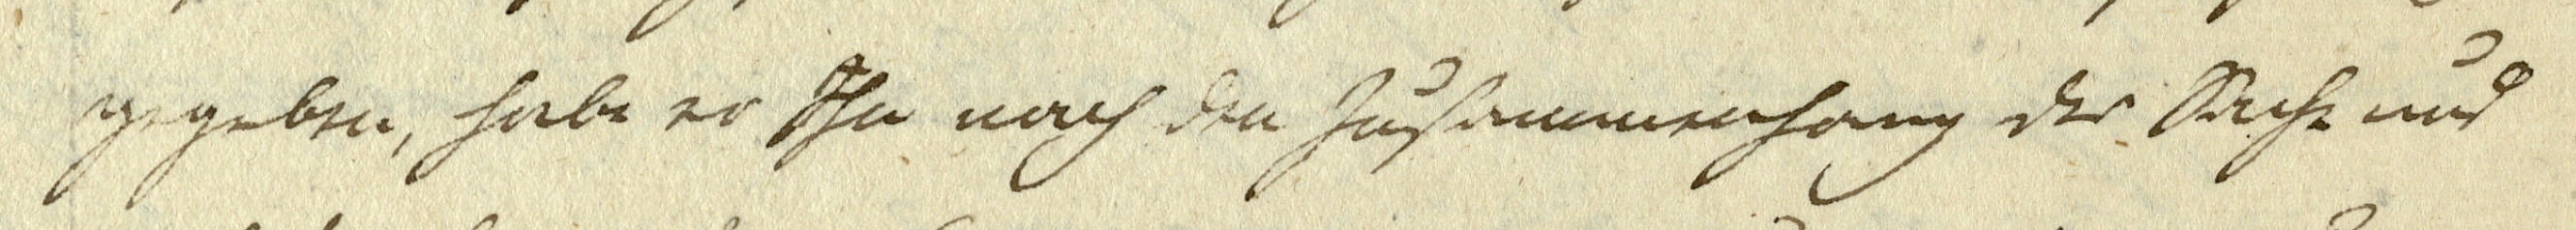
gegeben, habe er Ihn nach den Zusammenhang der Sache und
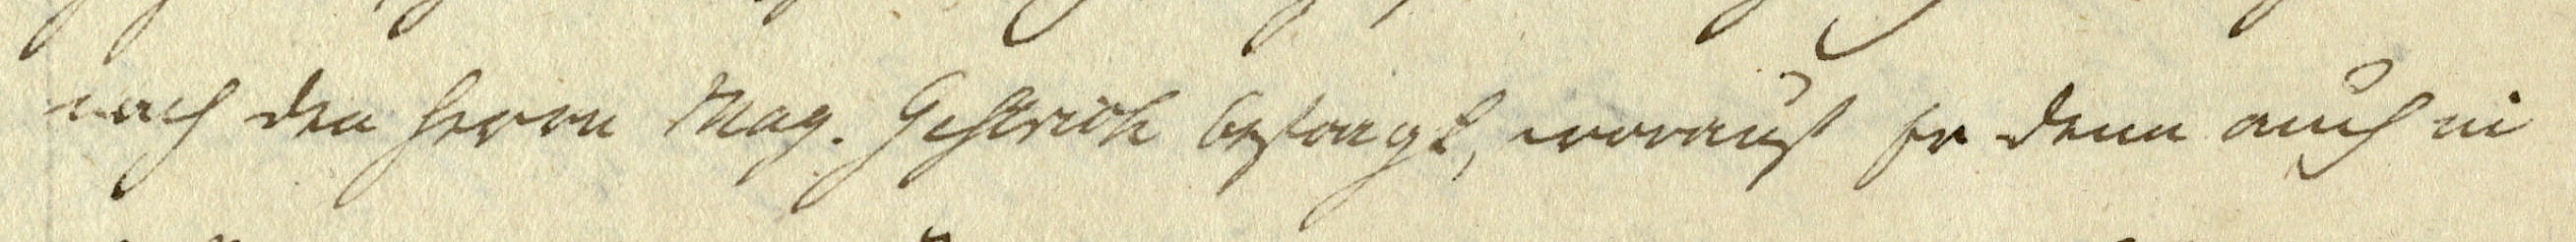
nach den Herrn Mag. Gestrich befragt, worauf Er denn auch in
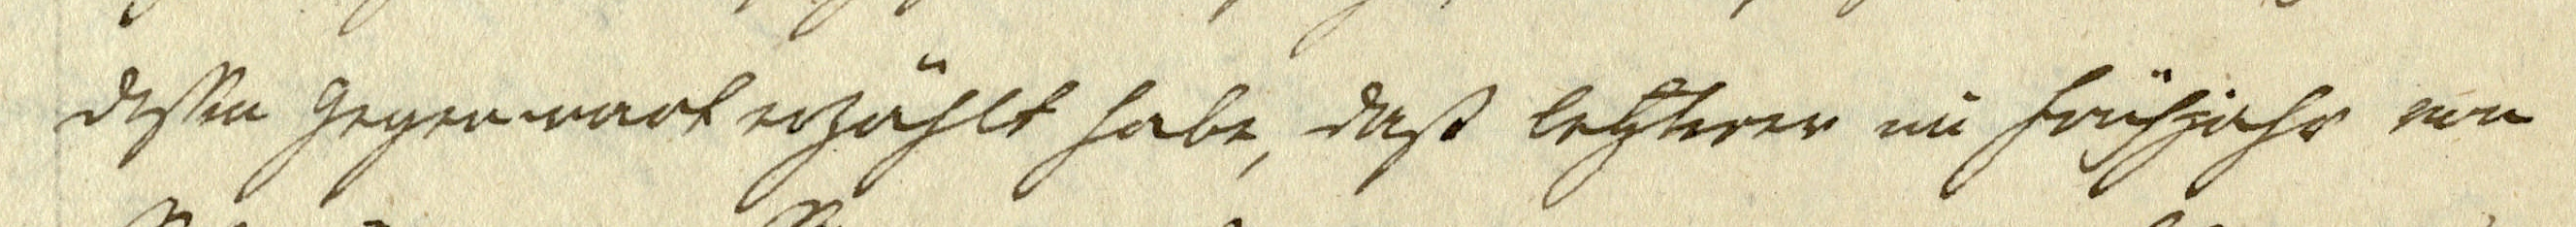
dessen Gegenwart erzählt habe, daß letzterer im Frühjahr von
